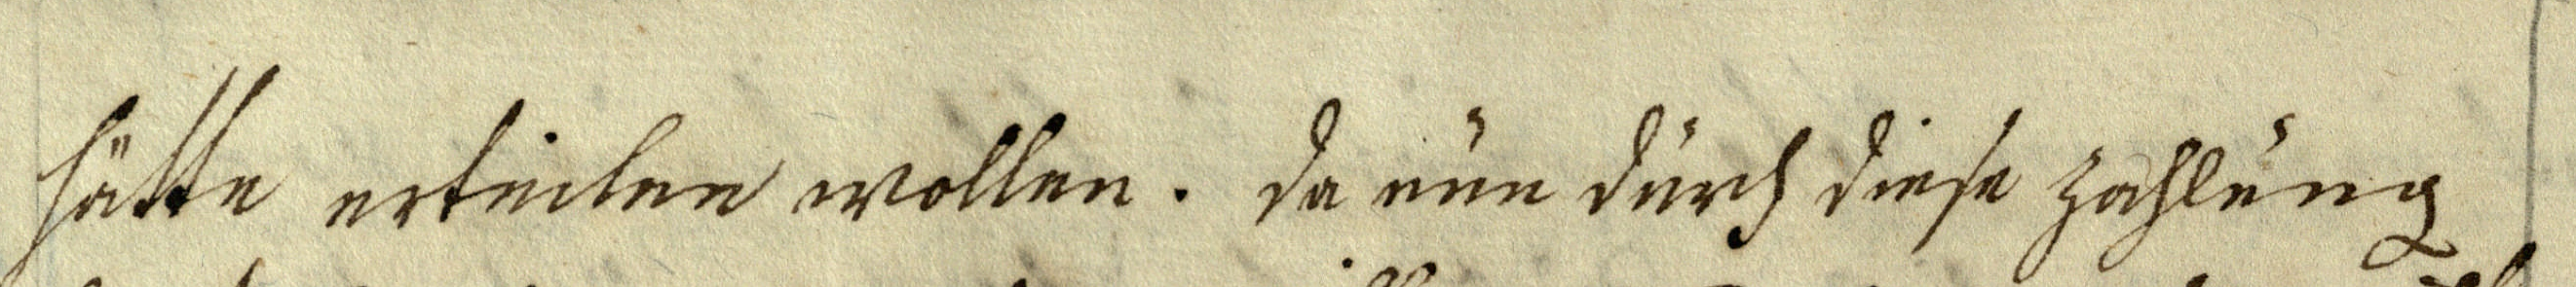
hätte erteilen wollen. Da nun durch diese Zahlung
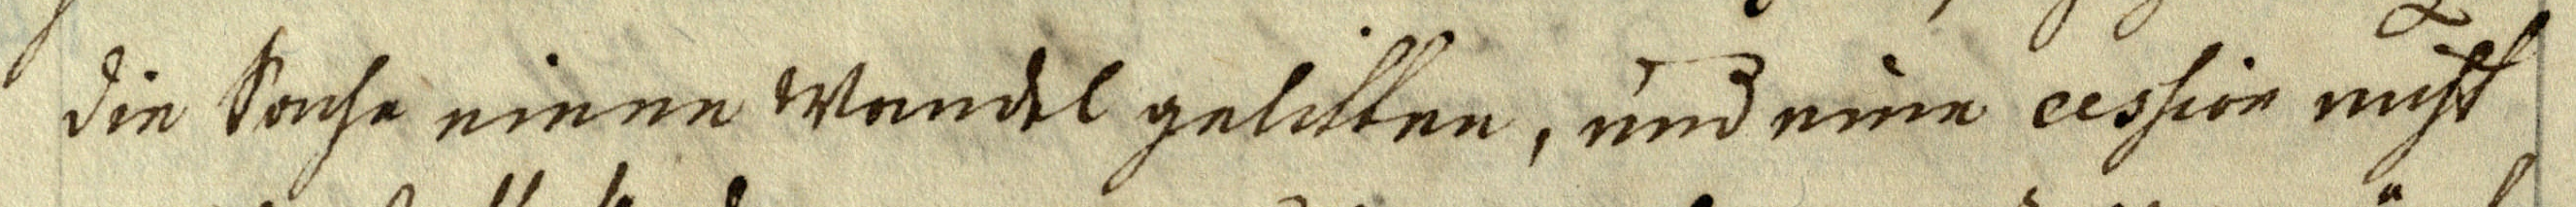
die Sache einen Wandel gelitten, und eine cession nicht
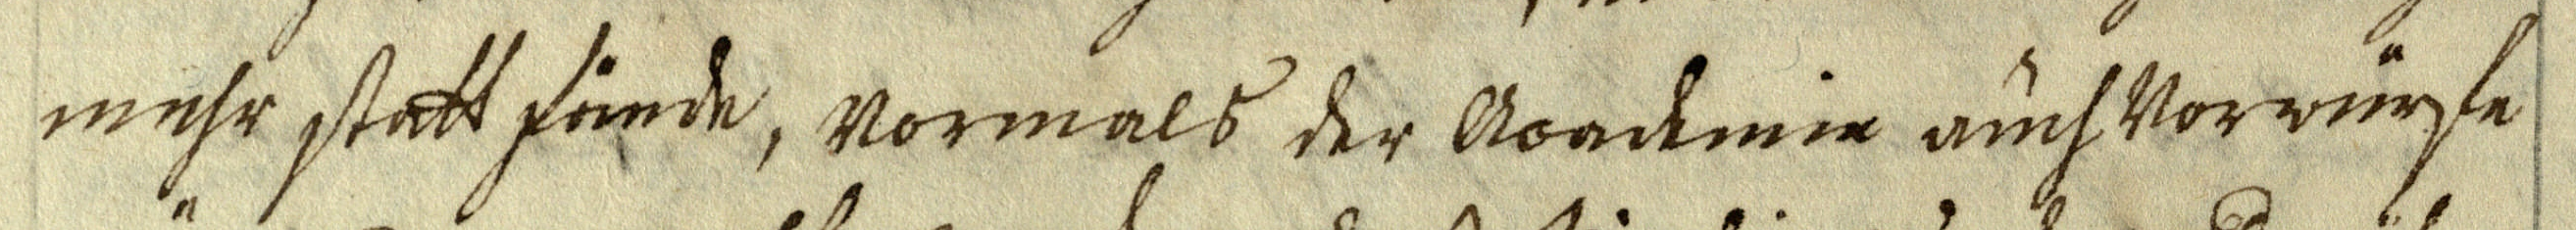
mehr statt fände, vormals der Academie auch Vorwürfe
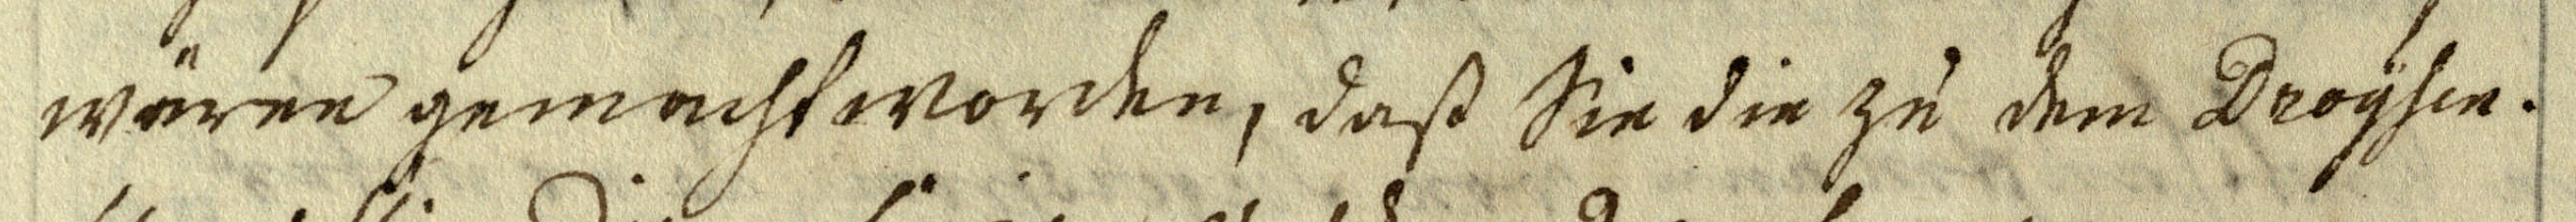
wären gemacht worden, daß Sie die zu dem Droÿsen¬
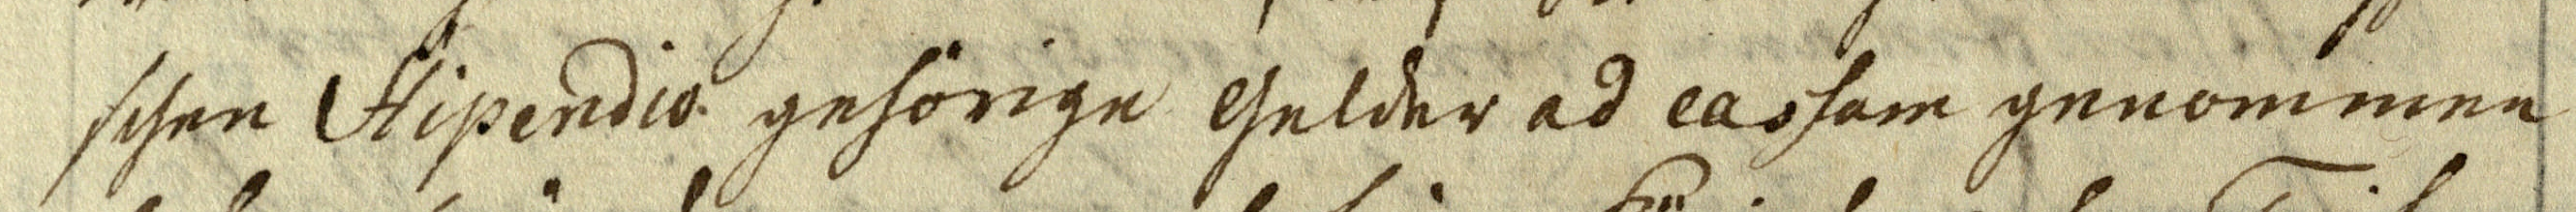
schen Stipendio gehörige Gelder ad cassam genommen
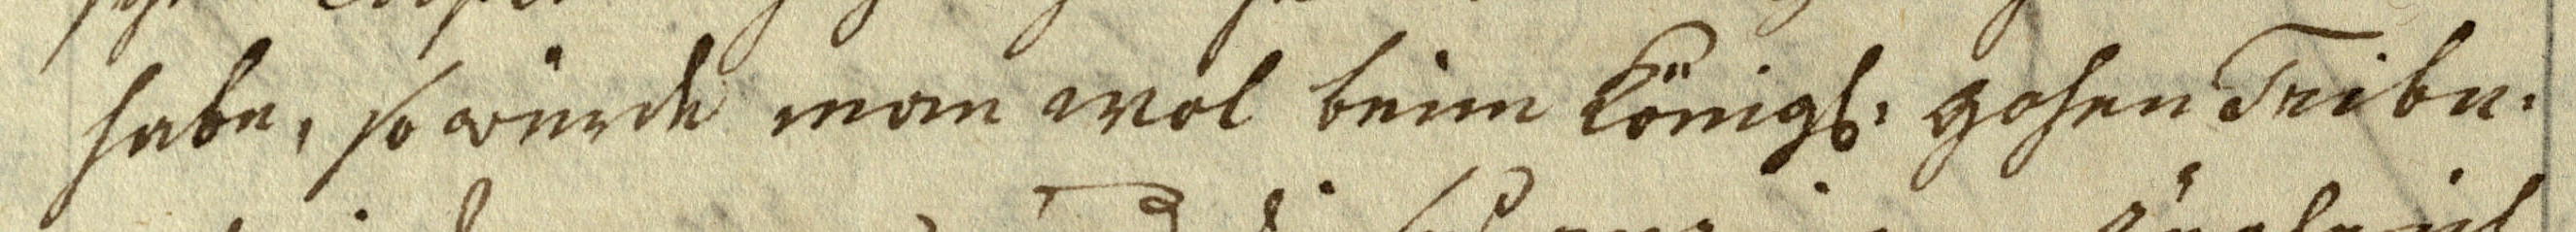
habe, so würde man wol beim Königl: hohen Tribu¬
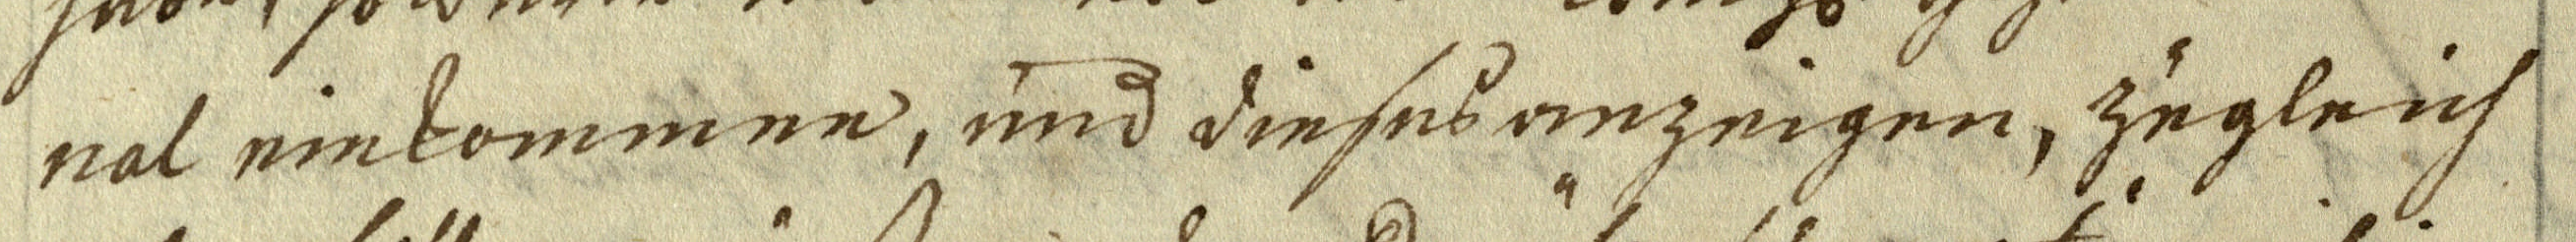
nal einkommen, und dieses anzeigen, zugleich
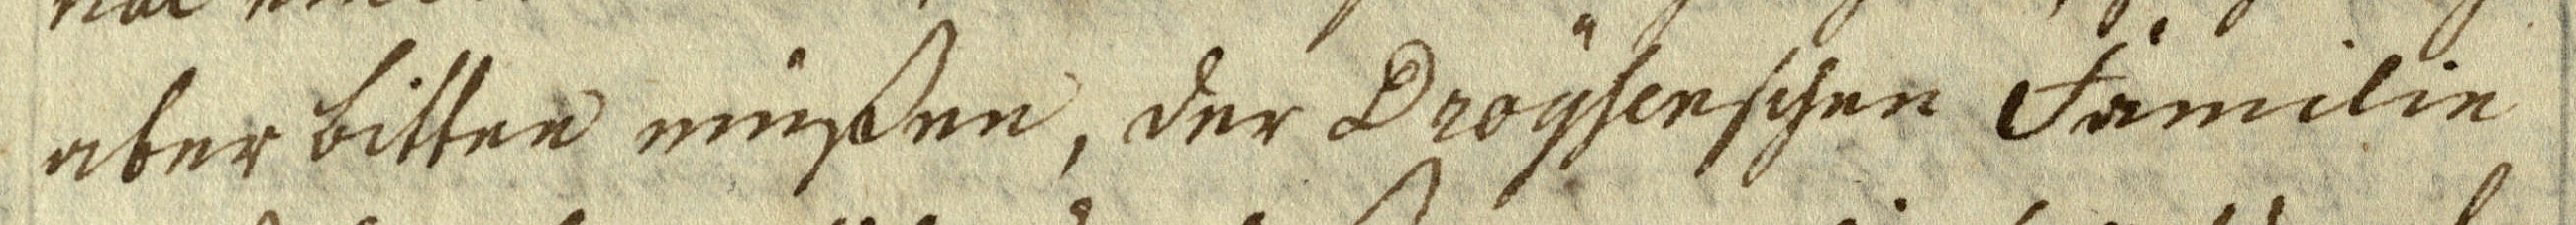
aber bitten müßen, der Droÿsenschen Familie
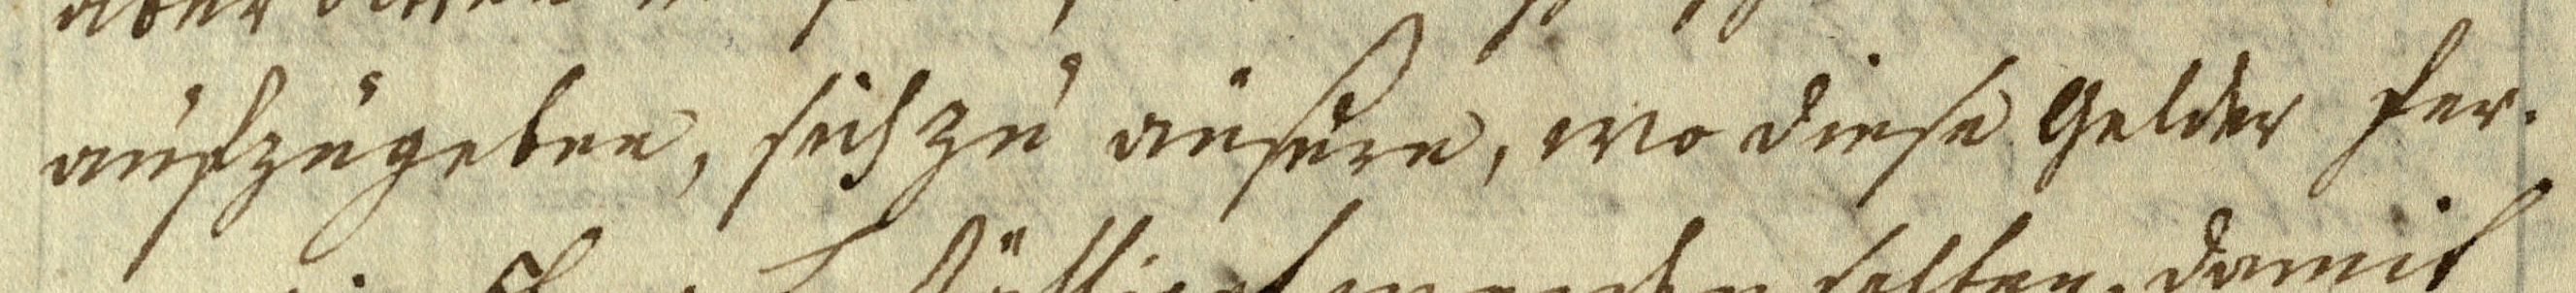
aufzugeben, sich zu äußern, wo diese Gelder fer¬
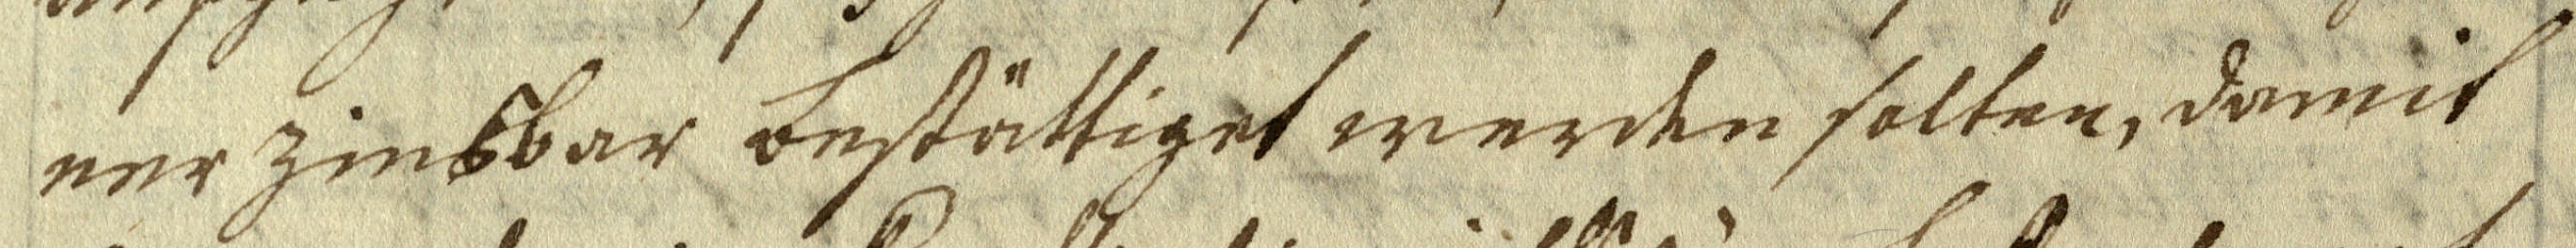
ner zinsbar bestättiget werden solten,damit
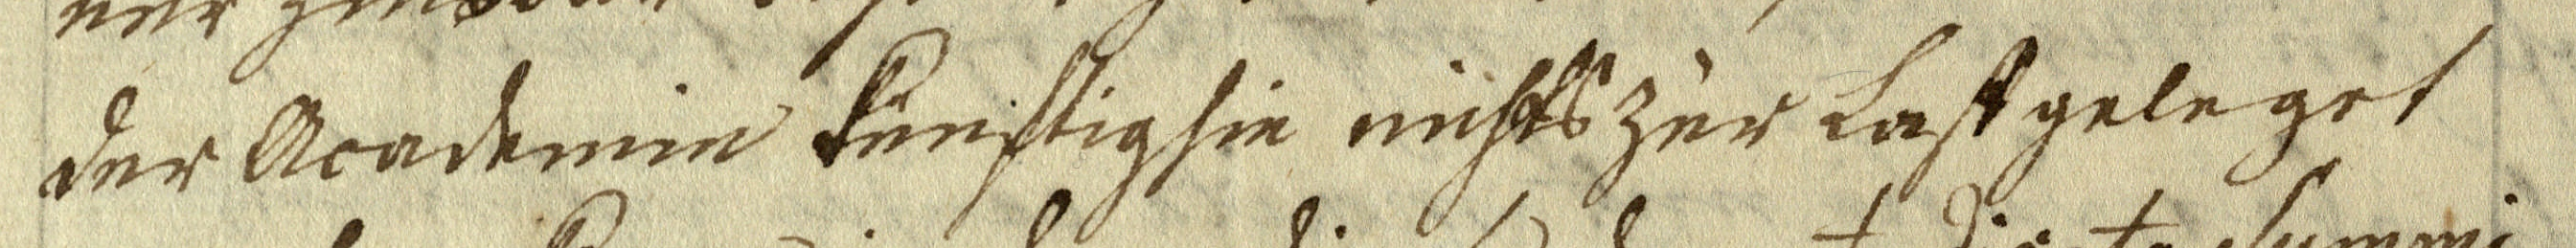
der Academie künftighin nichts zur Last geleget
